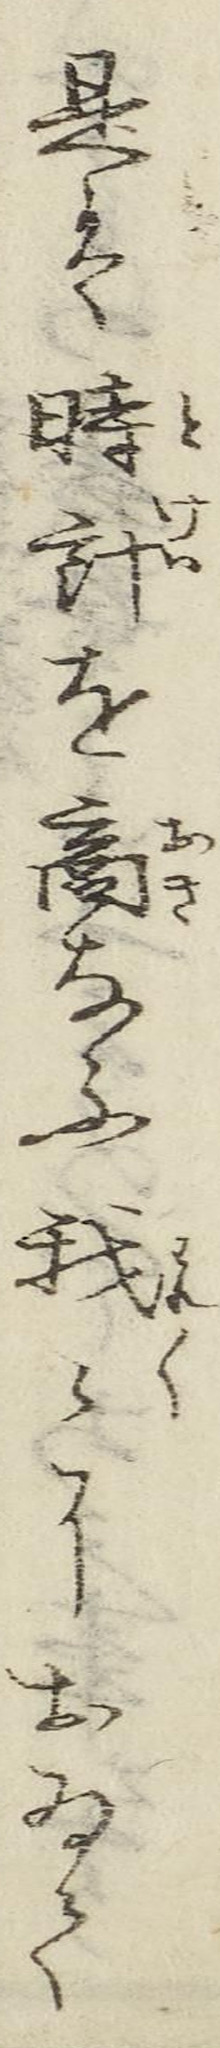是は時計を商なふ我〻におゐて

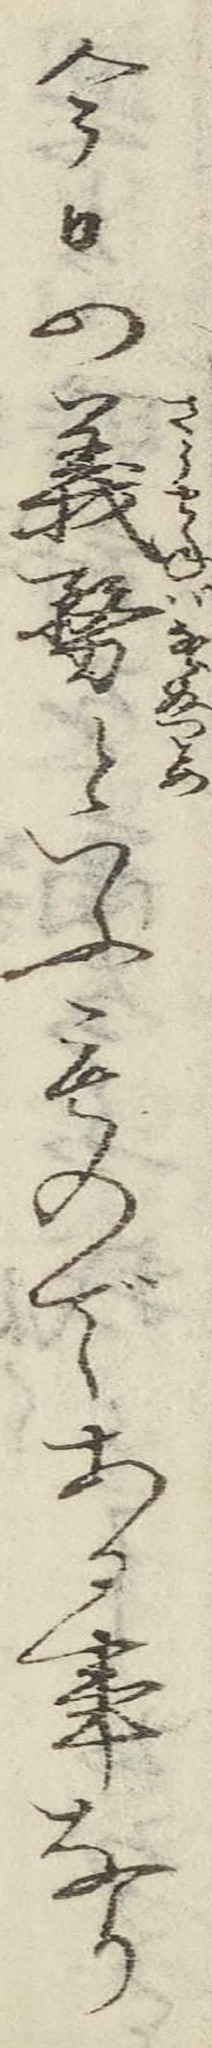今日の義務といふものである事なり
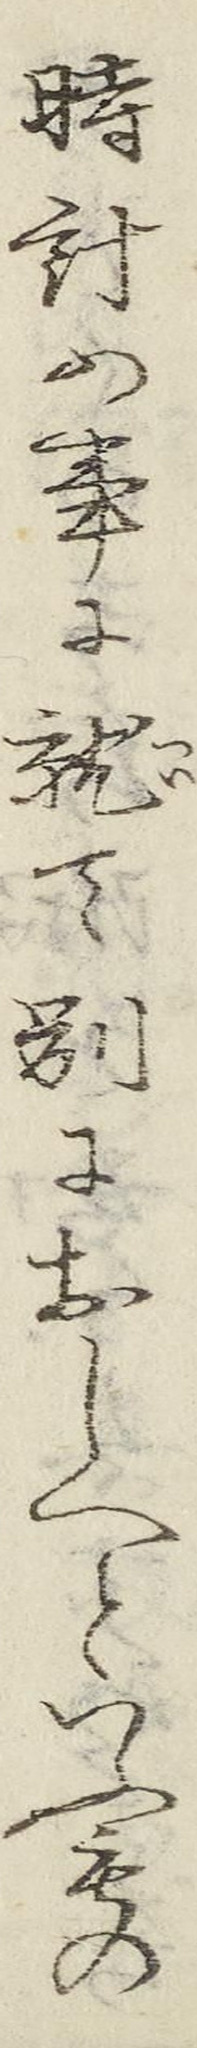時計の事に就て別におしへといふもの
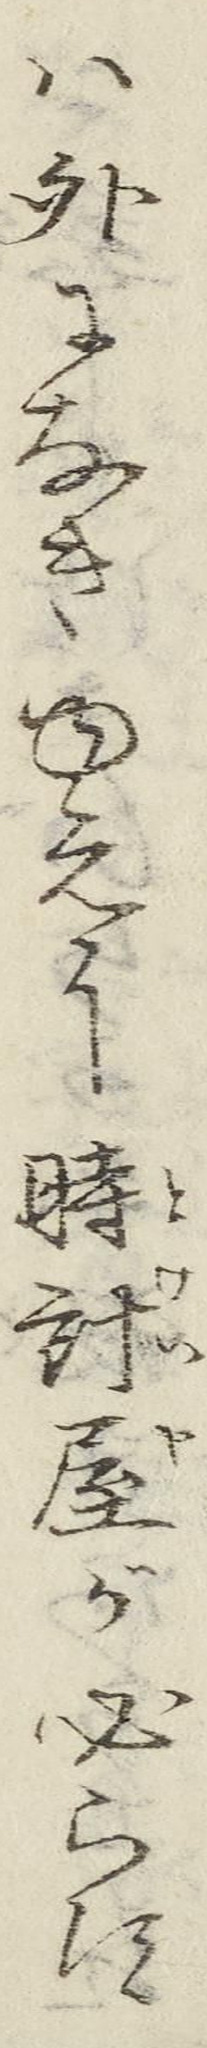は外になきゆえに時計屋が必らす
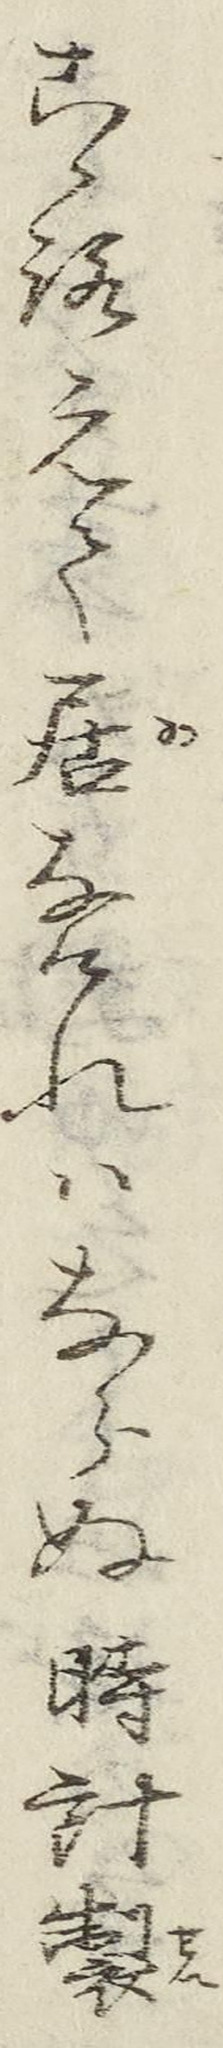こゝろえて居なけれはならぬ時計製
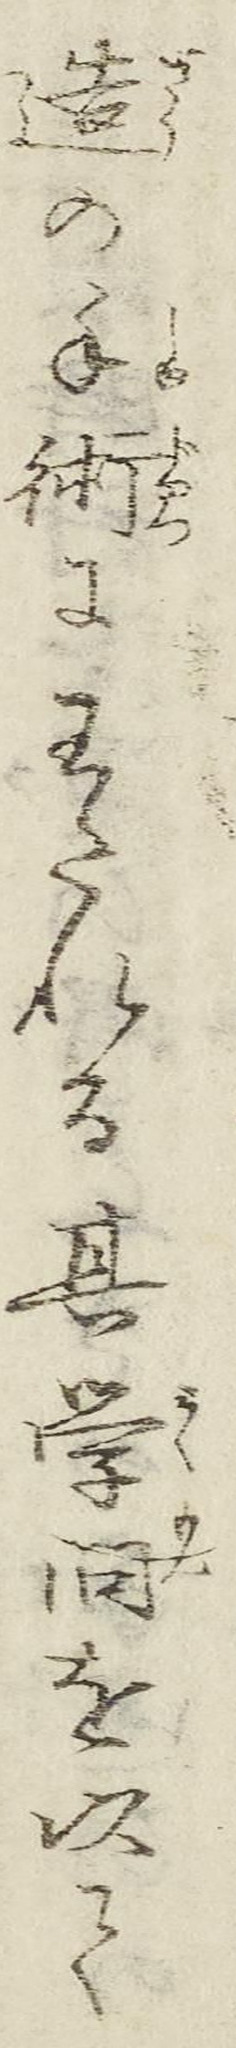造の手術にわたれる其学問を以て
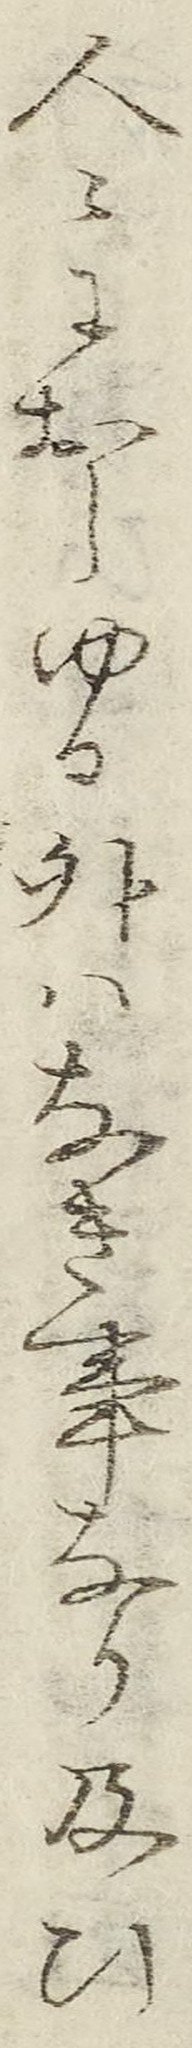人〻におしゆる外はなき事なり及ひ
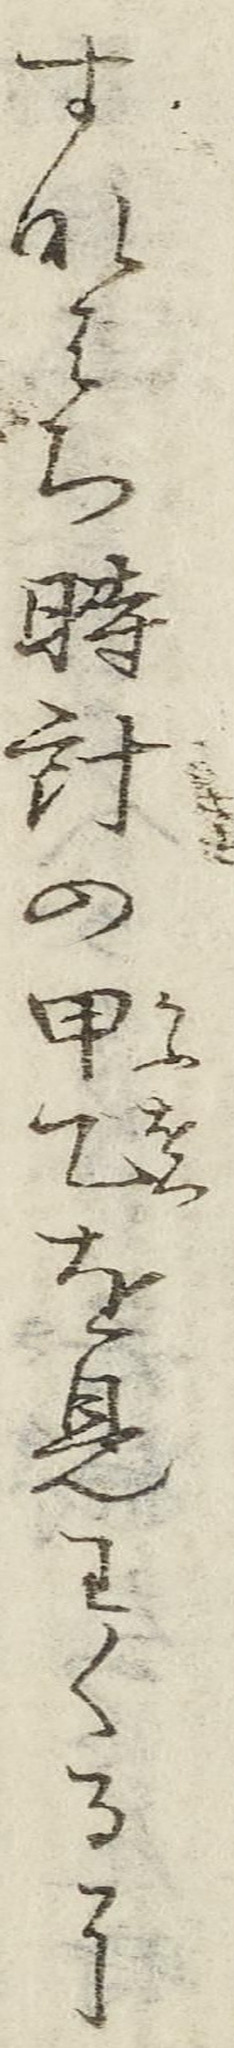すなはち時計の甲乙を見わくるに
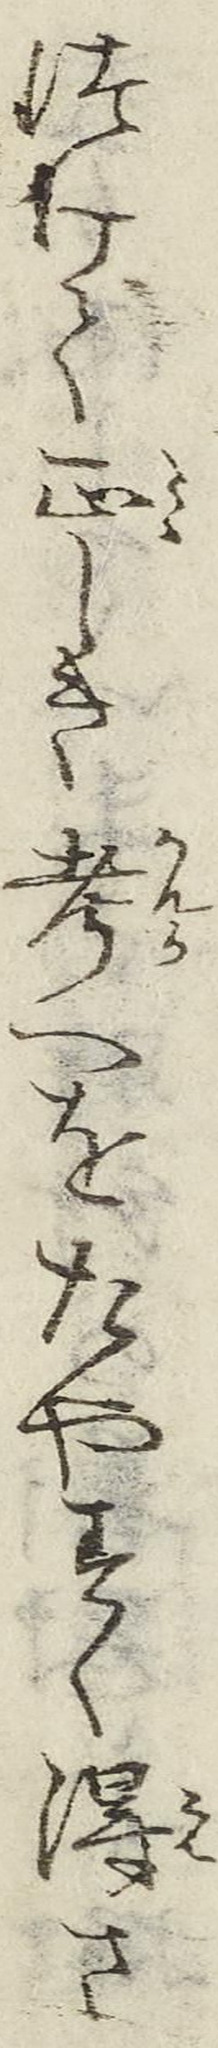つけて正しき考へをたやすく得さ
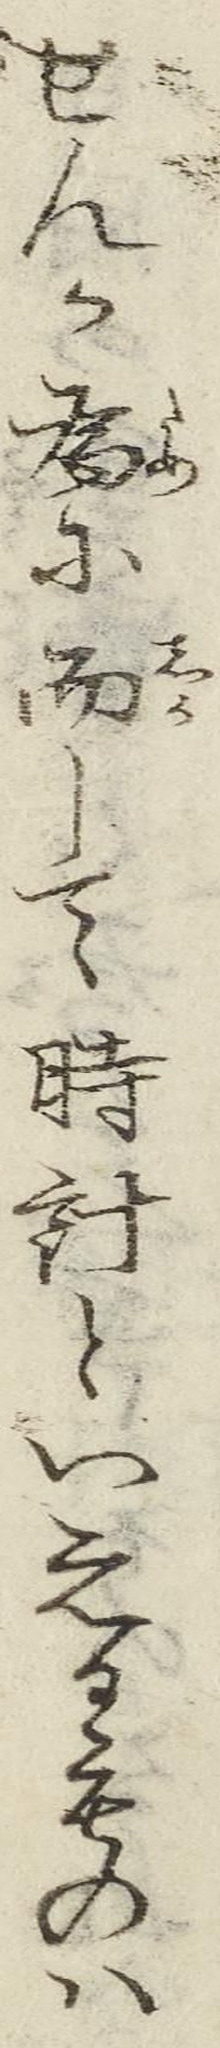せんか為に而して時計といえるものは
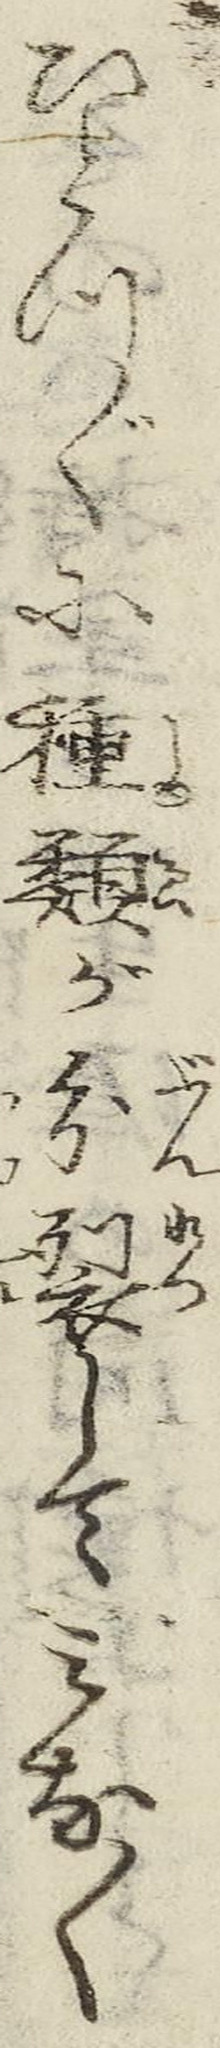ひとつ〴〵に種類が分裂してみな〳〵
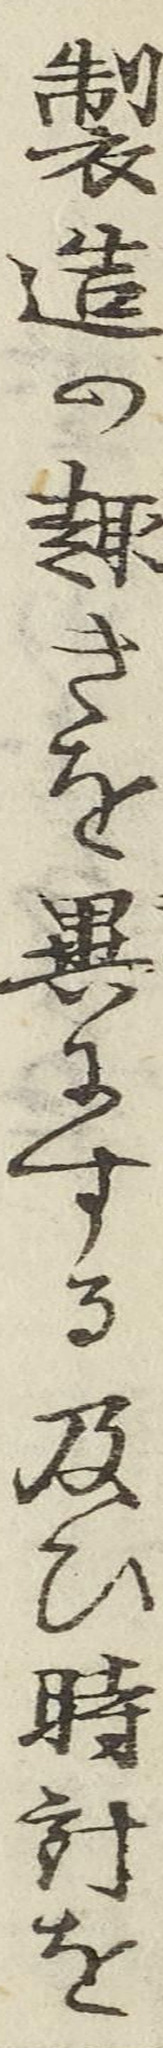製造の趣きを異にする及ひ時計を
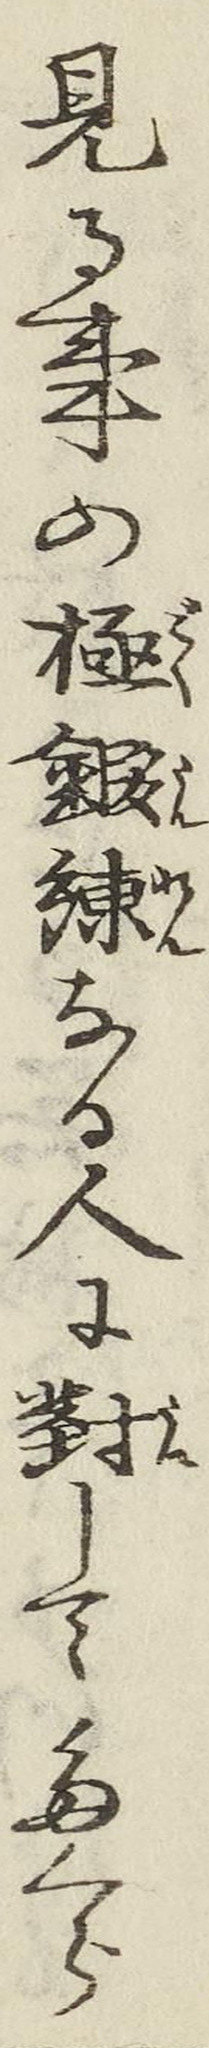見る事の極鍛錬なる人に対して多くら
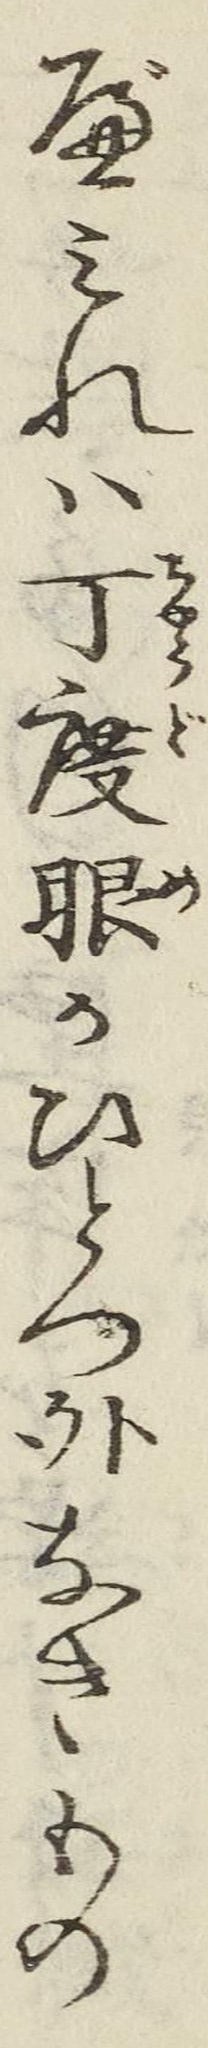べみれは丁度眼かひとつ外なきもの
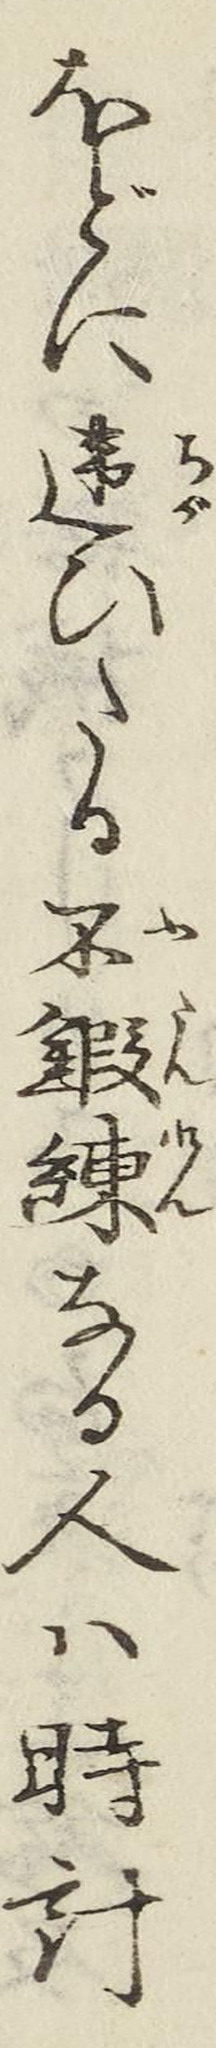ほどに違ひたる不鍛錬なる人は時計
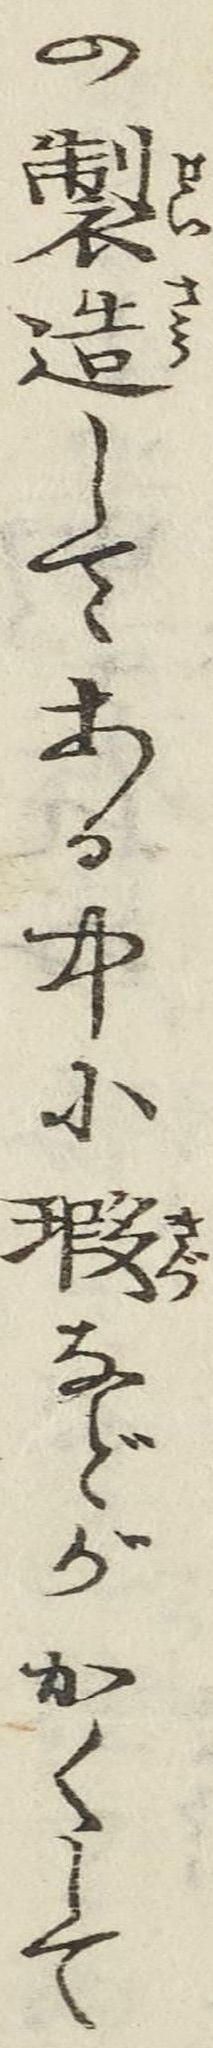の製造してある中に瑕などがかくして
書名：[時計に関する冊子]
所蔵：東京大学地震研究所図書室 Earthquake Research Institute Library, The University of Tokyo, JAPAN
